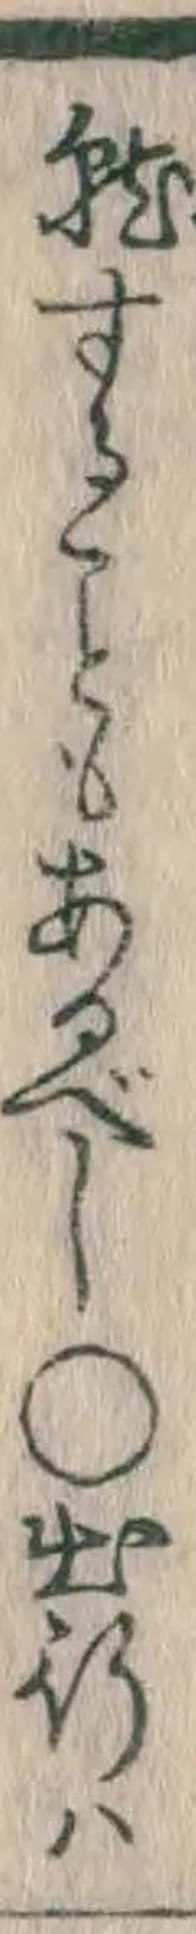就することもあるべし○出行は
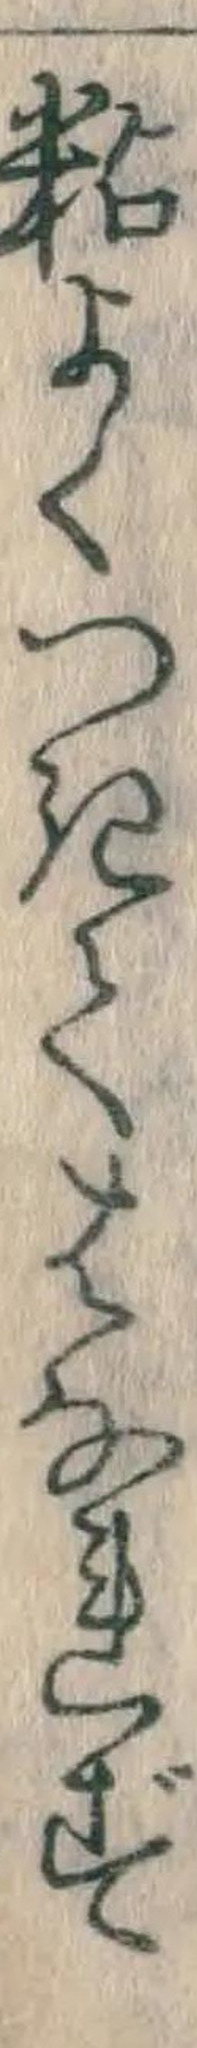粘よくつきてはなれず
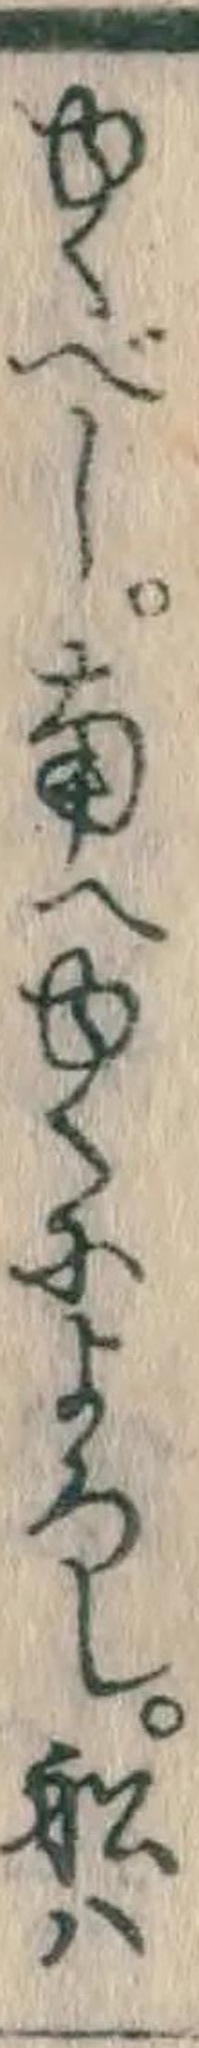ゆくべし。南へゆくによろし。船は
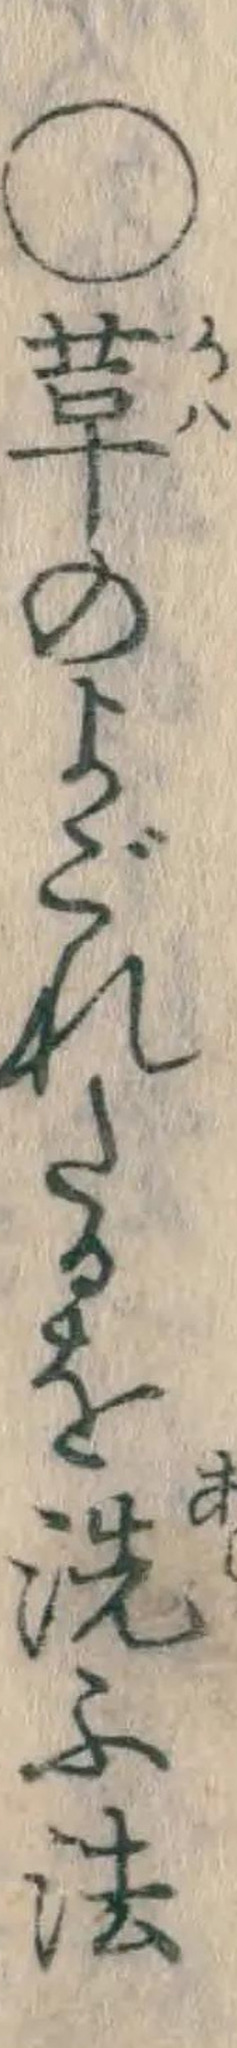○革のよごれたるを洗ふ法
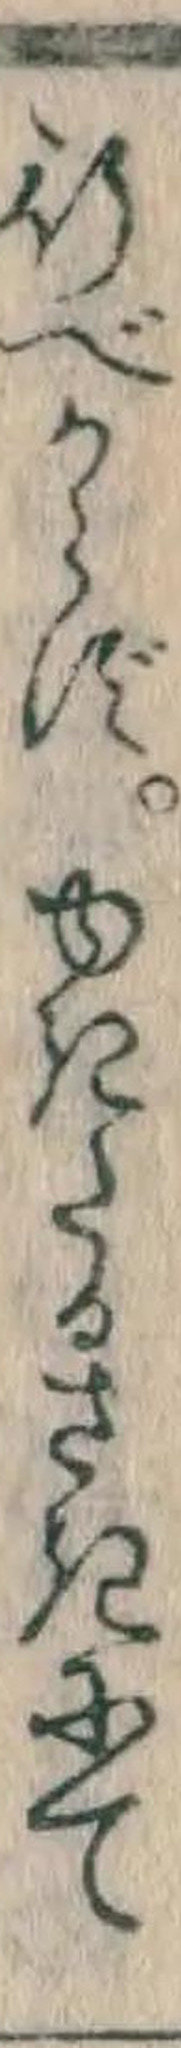行べからず。ゆきたるさきにて
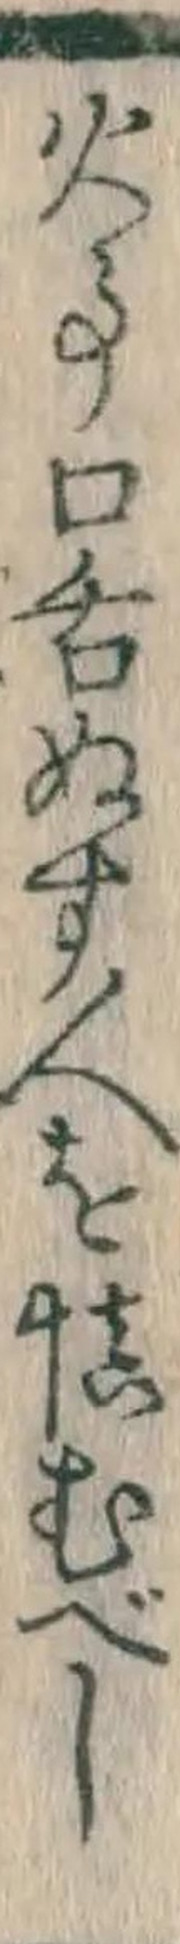火事口舌ぬす人を慎むべし
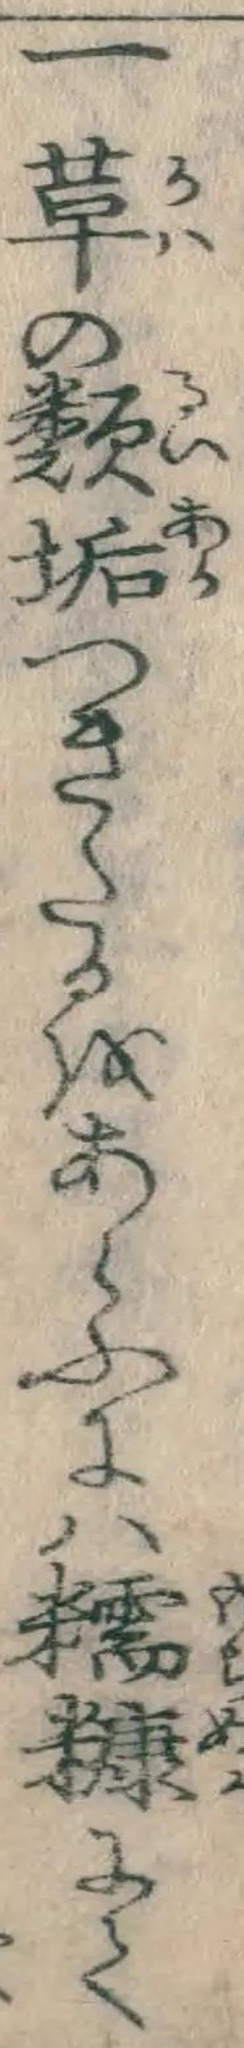一革の類垢つきたるをあらふには糯糠にて
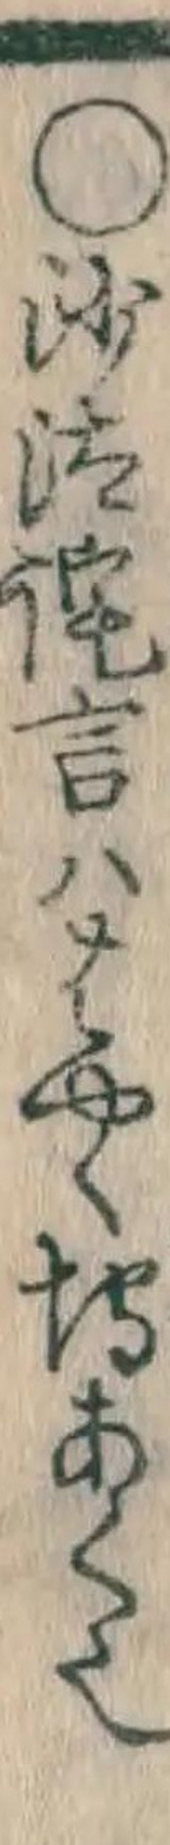○沙汰詫言ははやく埓あく也
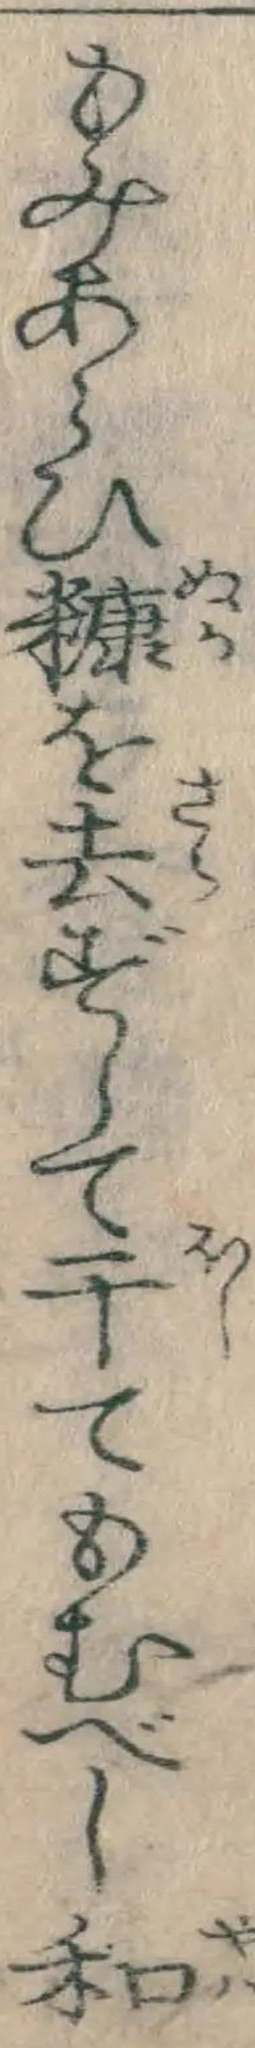もみあらひ糠を去らずして干てもむべし和

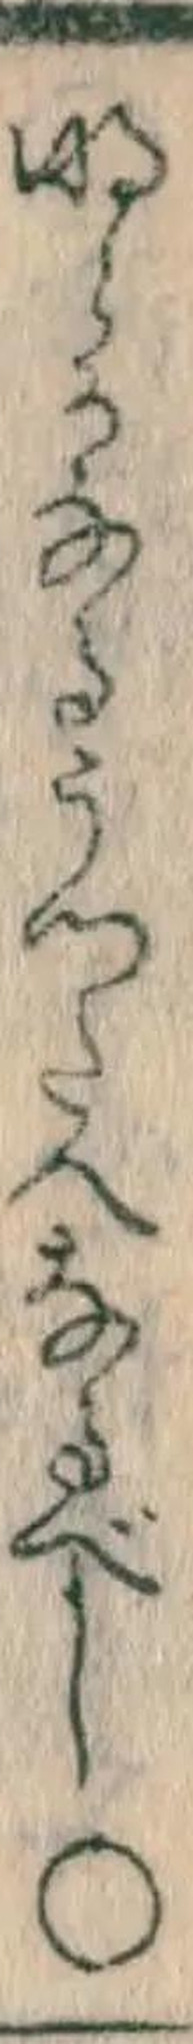明らかなるうつたへなるべし○
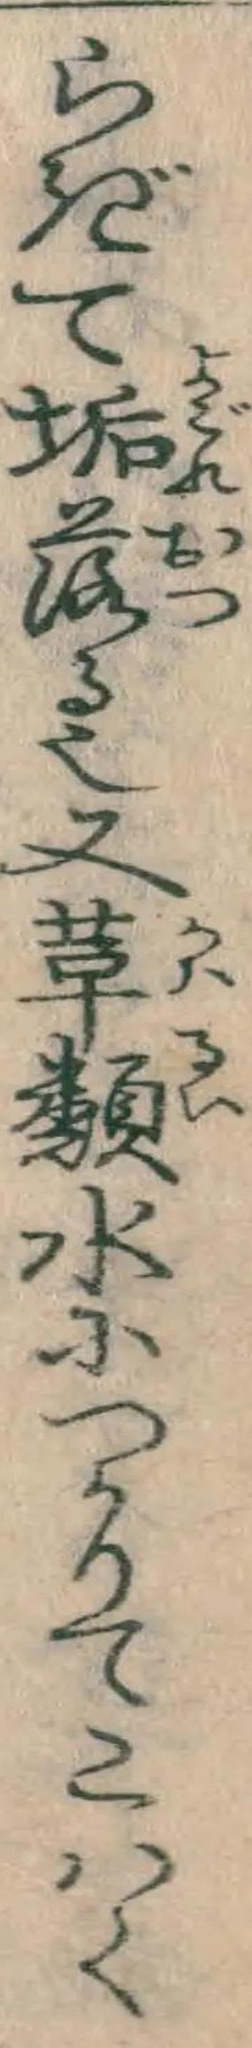らぎて垢落る也又革類水につかりてこはく
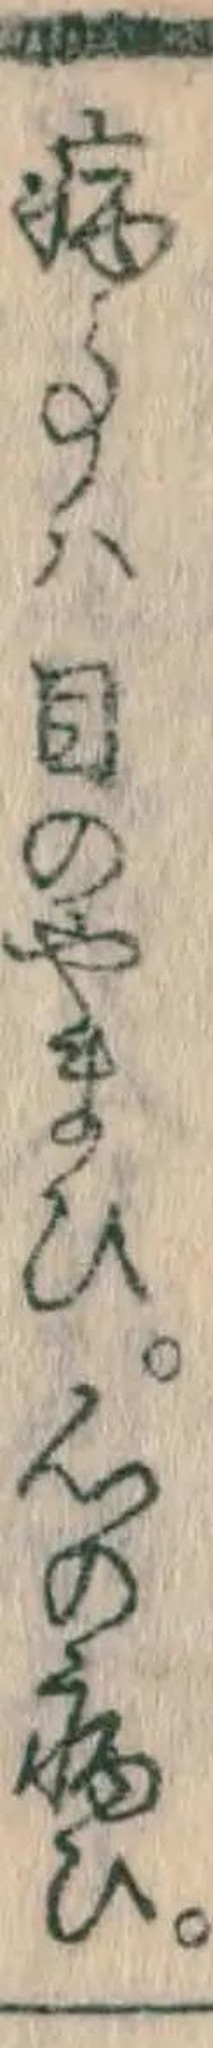病事は目のやまひ。心の病ひ。
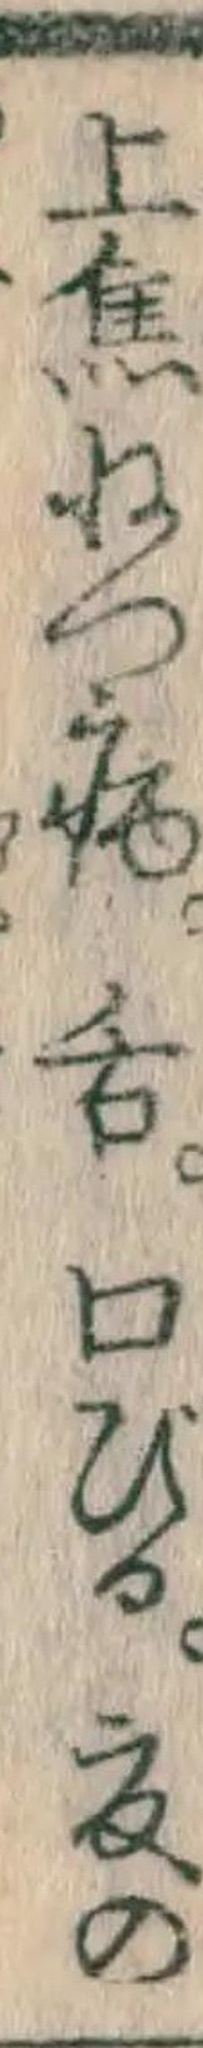上焦ねつ病。舌。口びる。夏の
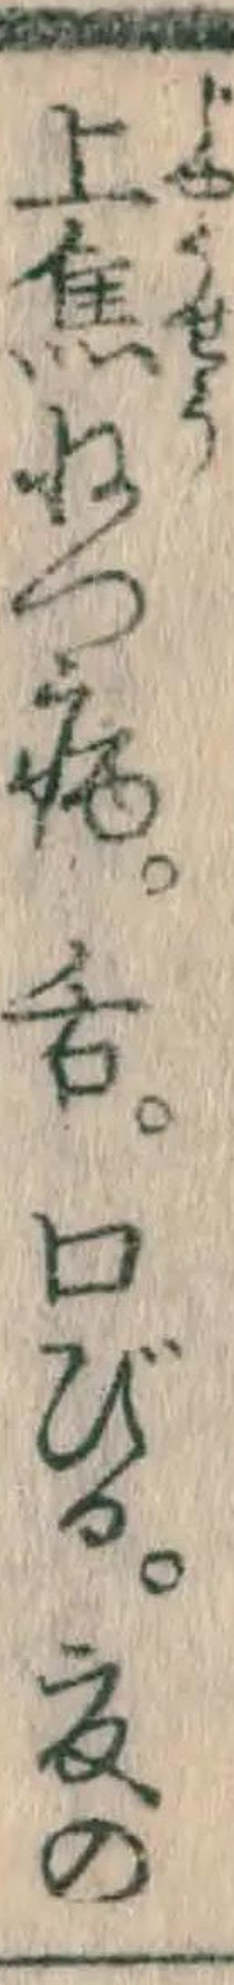上焦ねつ病。舌。口びる。夏の
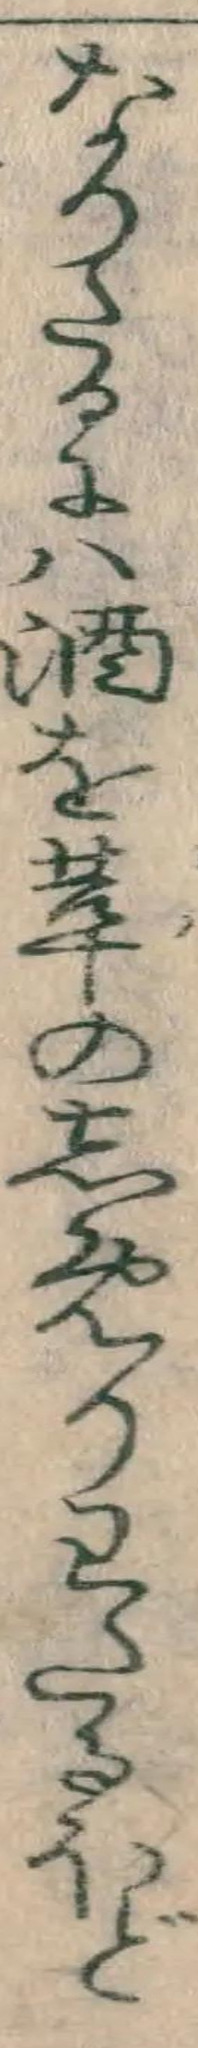なりたるには酒を革のしめりわたるほど
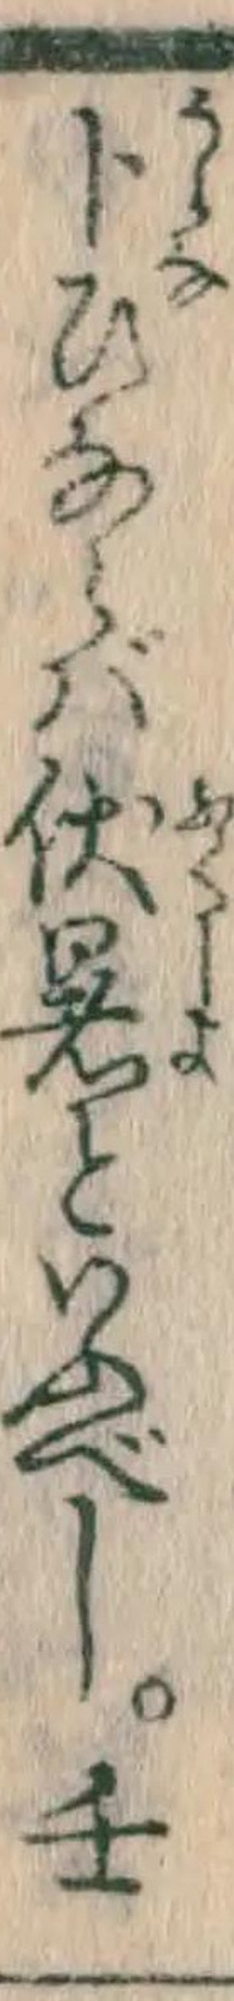卜ひならば伏暑といふべし。壬
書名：広益秘事大全 3巻. [1]
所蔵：国立国会図書館 National Diet Library, JAPAN
